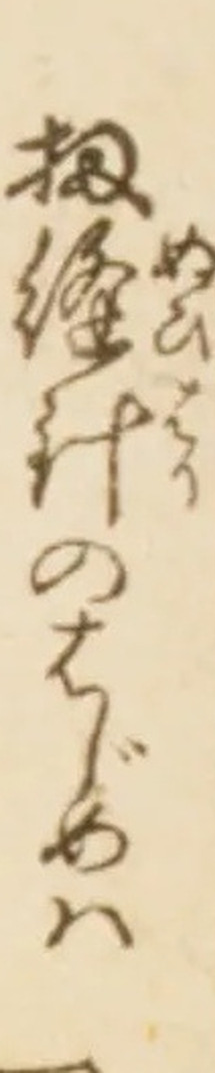扨縫針のはじめは
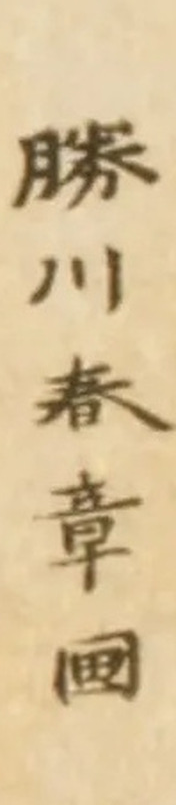勝川春章画
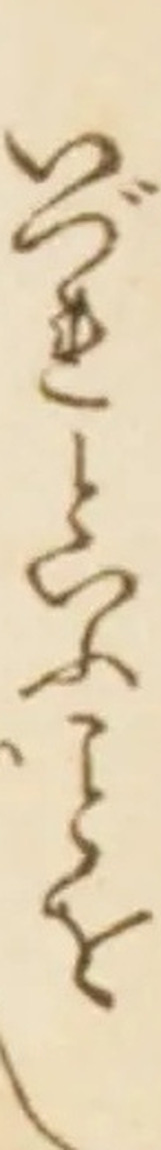いづれといふことを
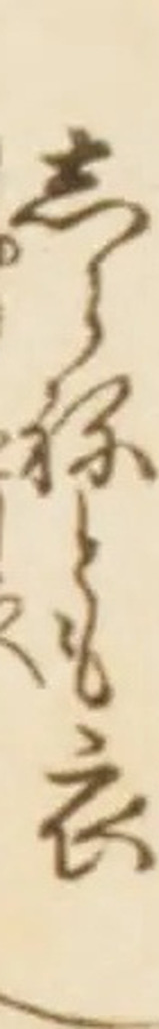しらねとも衣
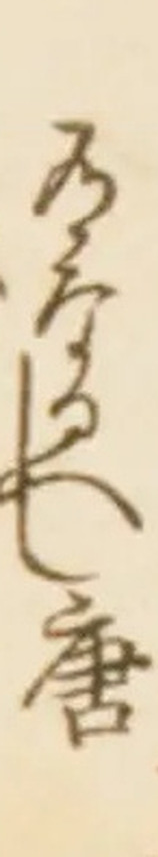道なるへし唐
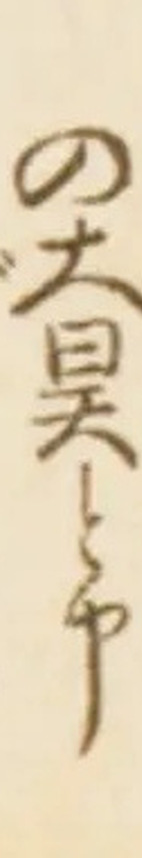の大昊と申
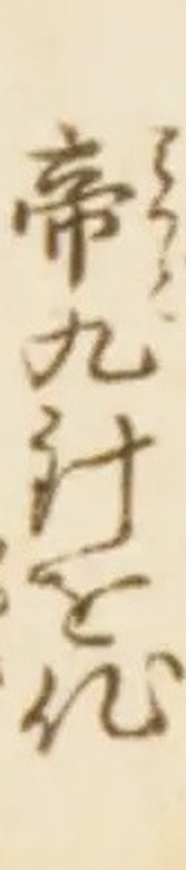帝九針を作
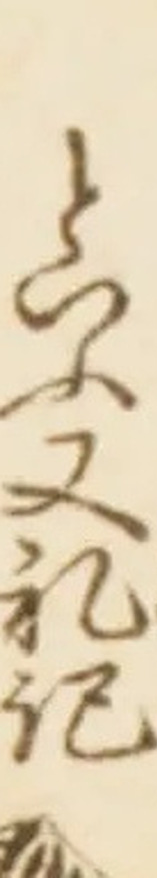といふ又礼記
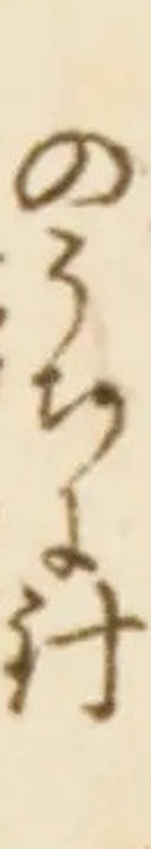のうちに針
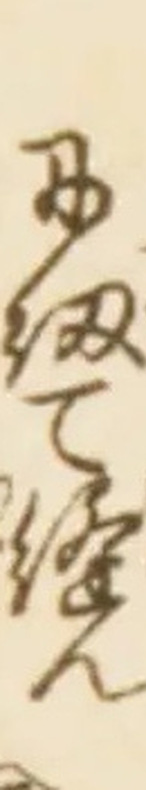に紉て縫ん
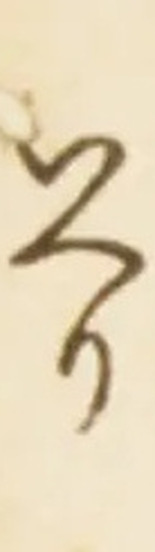いへり
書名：画本宝能縷
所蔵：国立国会図書館 National Diet Library, JAPAN
